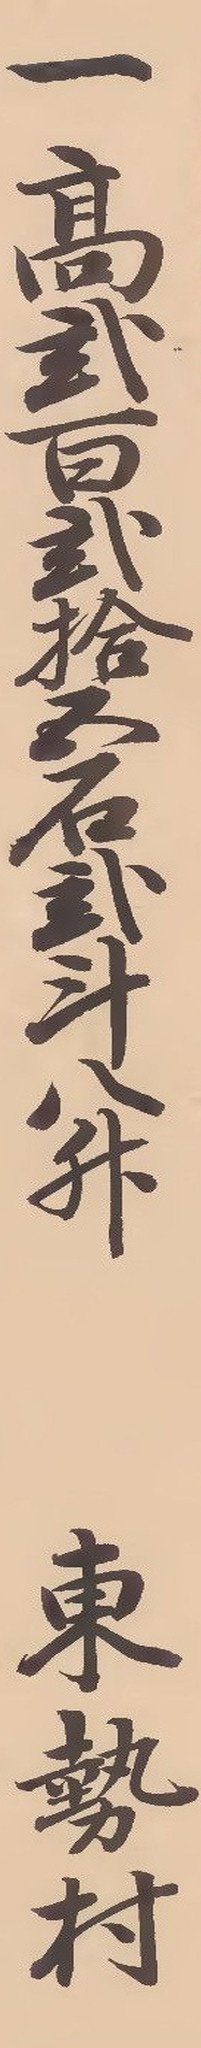一高弐百弐拾五石弐斗八升東勢村
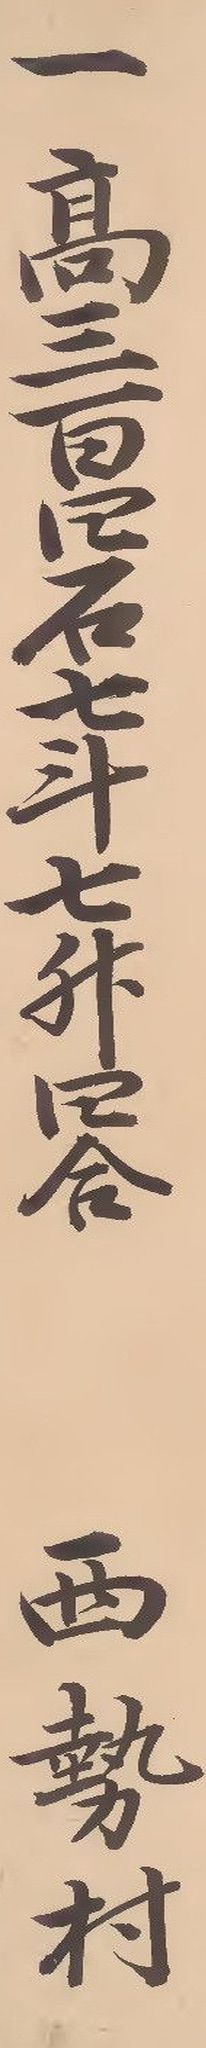一高三百四石七斗七升四合西勢村

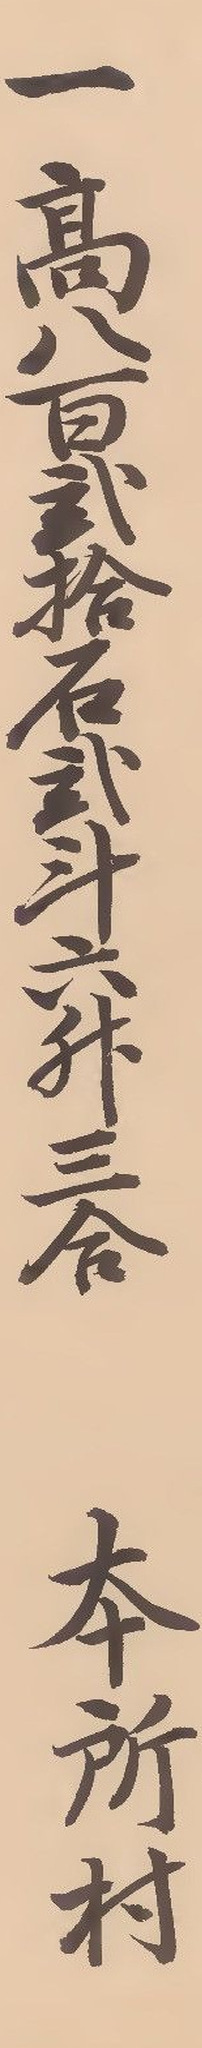一高八百弐拾石弐斗六升三合本所村
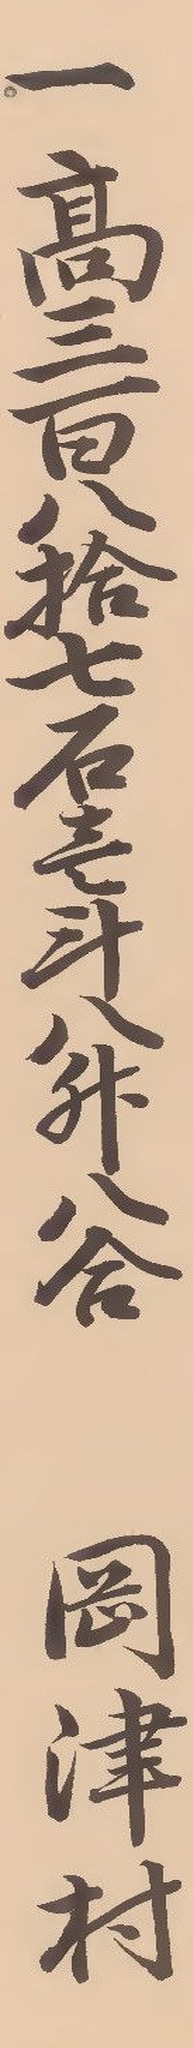一高三百八拾七石壱斗八升八合岡津村
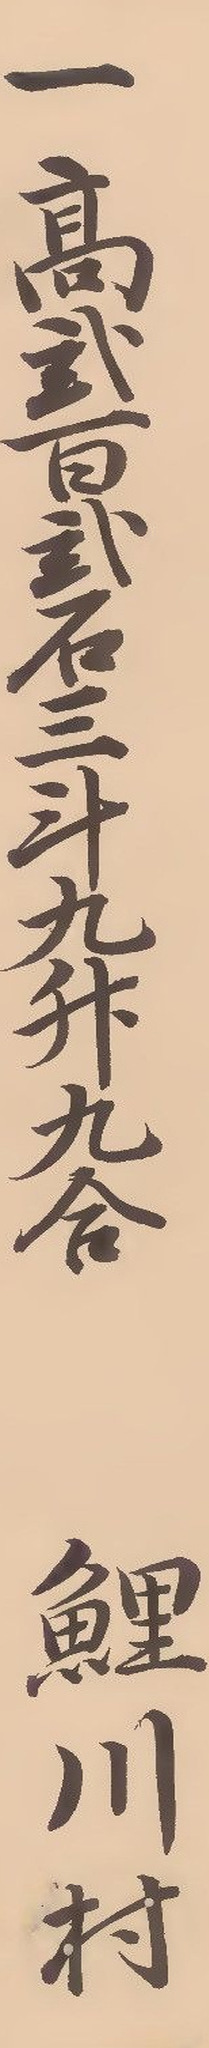一高弐百弐石三斗九升九合鯉川村
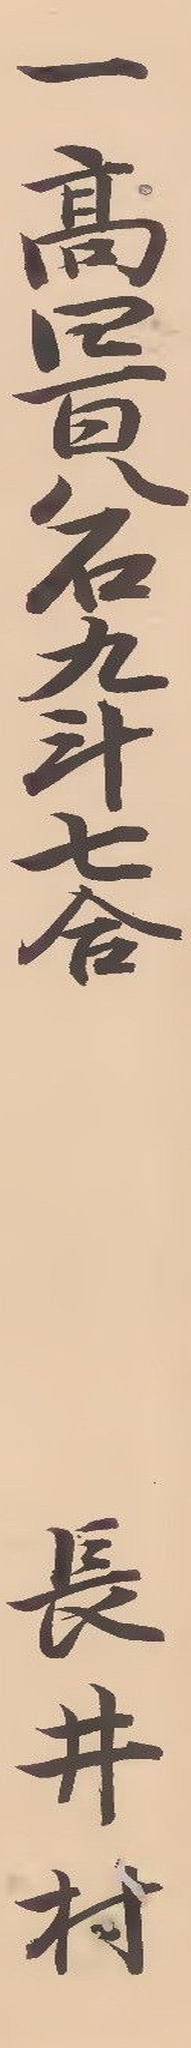一高四百八石九斗七合長井村
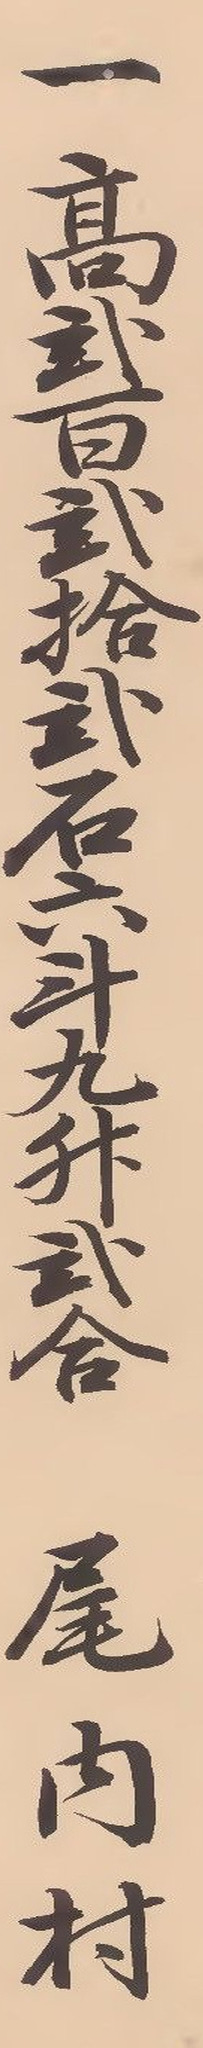一高弐百弐拾弐石六斗九升弐合尾内村
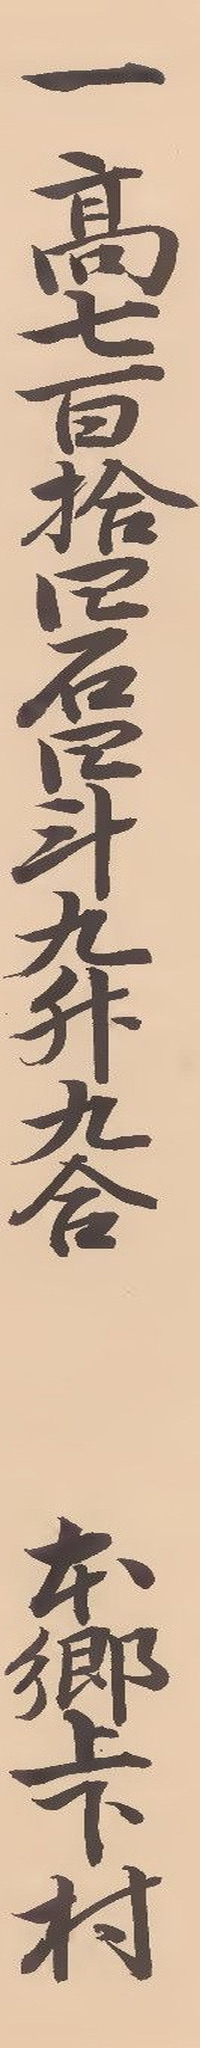一高七百拾四石四斗九升九合本郷上下村
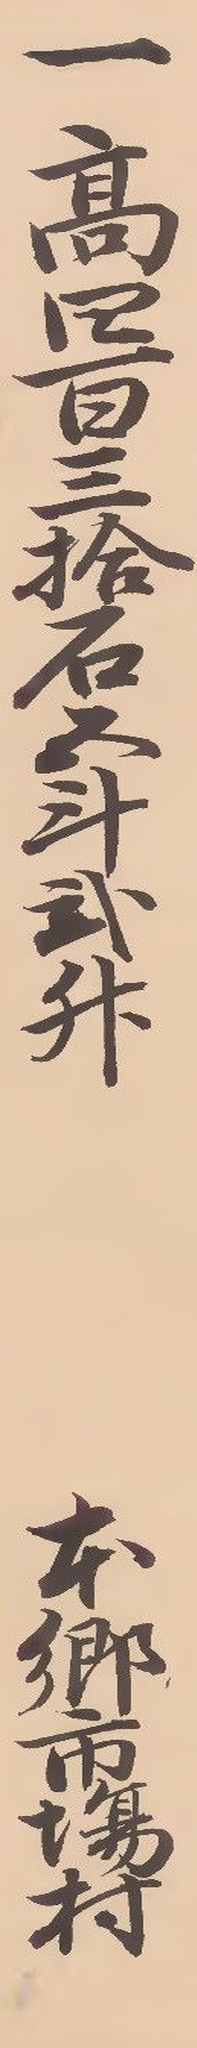一高四百三拾石五斗弐升本郷市場村

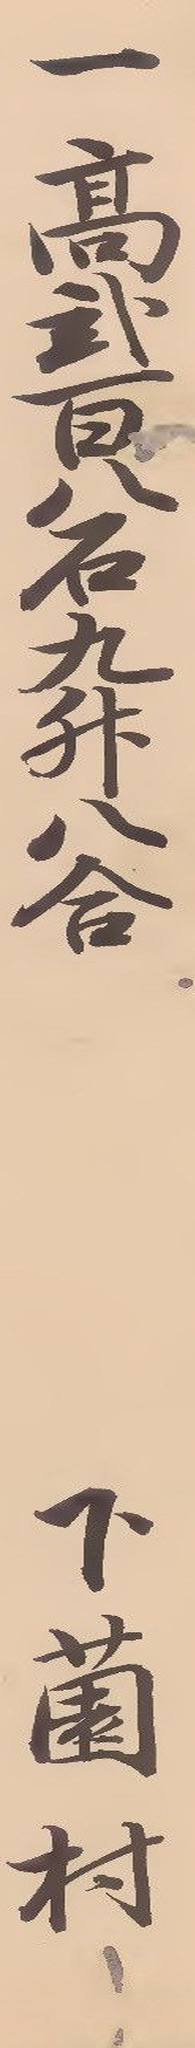一高弐百八石九升八合下薗村
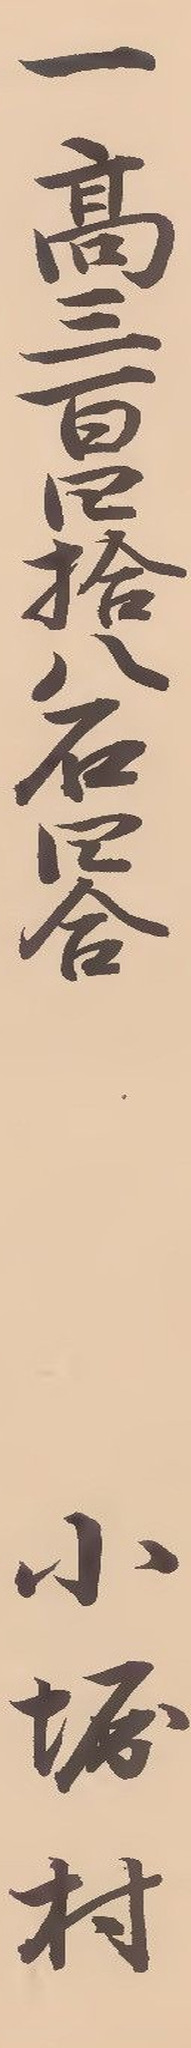一高三百四拾八石四合小堀村
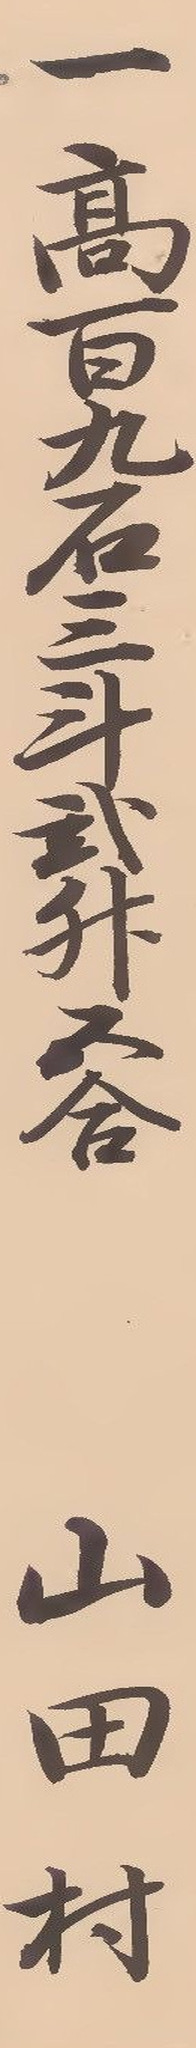一高百九石三斗弐升五合山田村
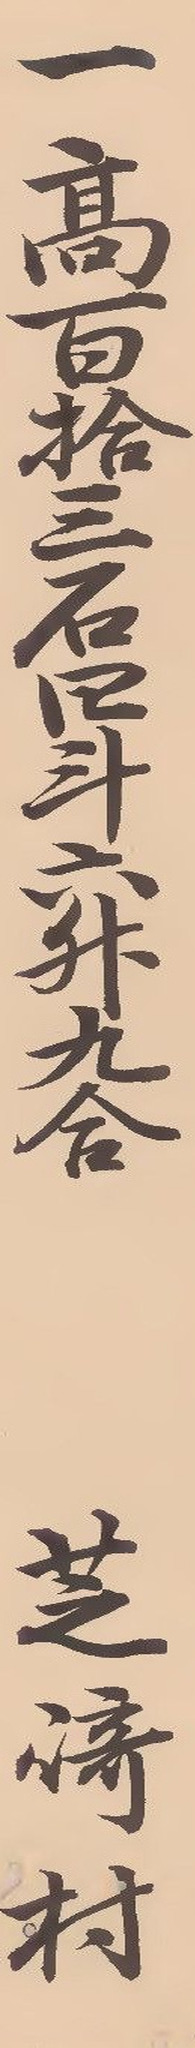一高百拾三石四斗六升九合芝崎村
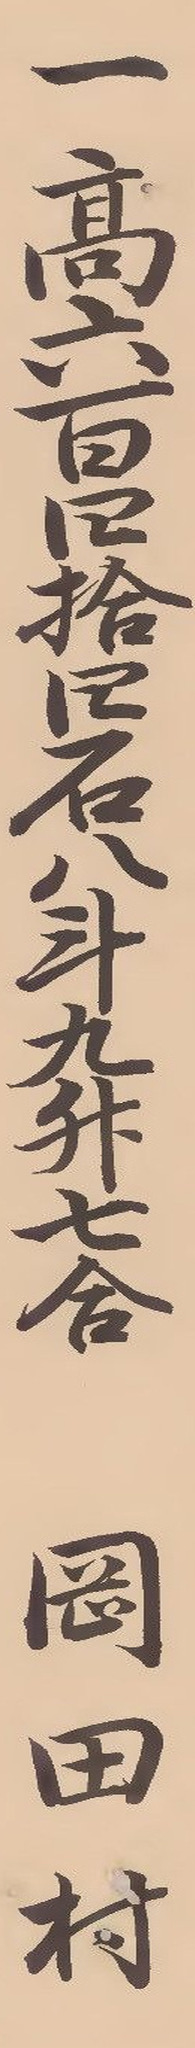一高六百四拾四石八斗九升七合岡田村
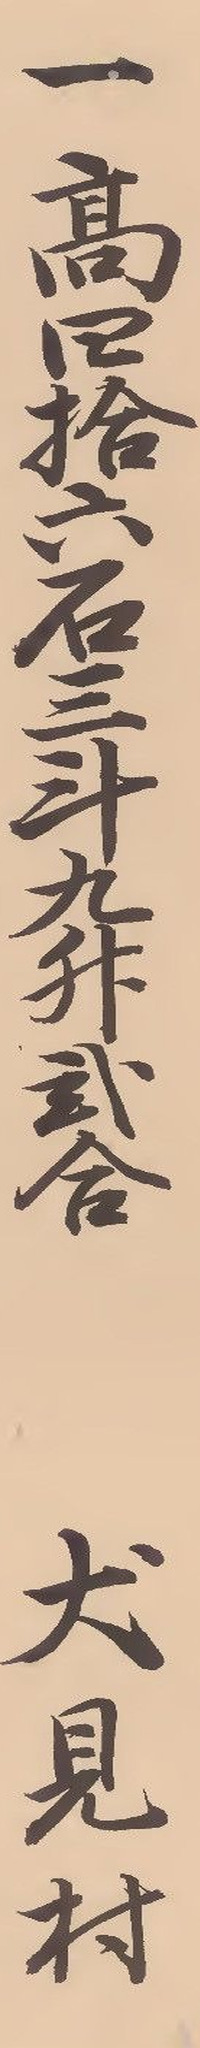一高四拾六石三斗九升弐合犬見村
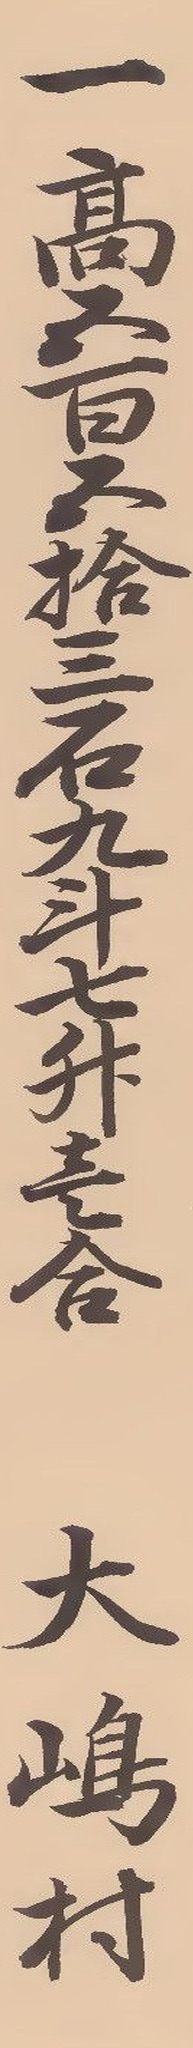一高五百五拾三石九斗七升壱合大島村
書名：若狭国郷帳
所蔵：国立公文書館 National Archives of Japan
